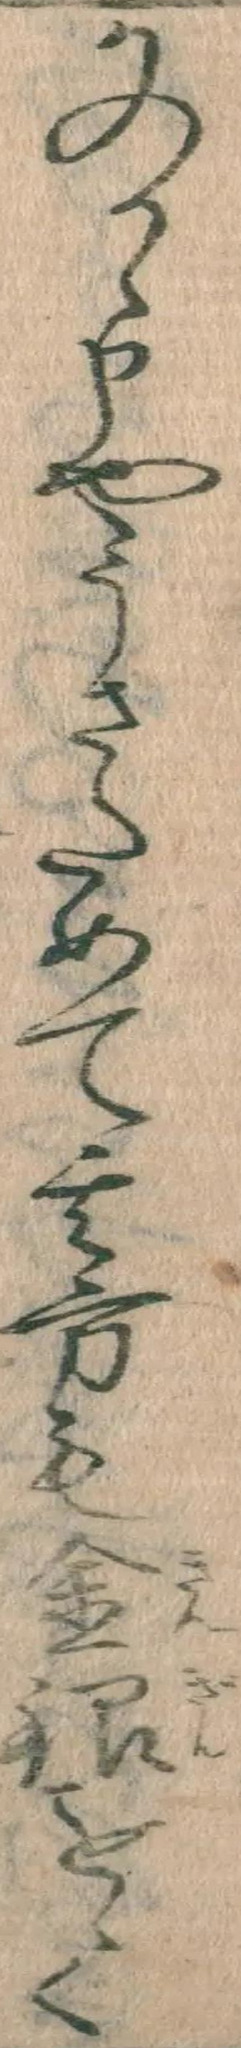かのかゝ申やうさためて其方も金銀をゝく
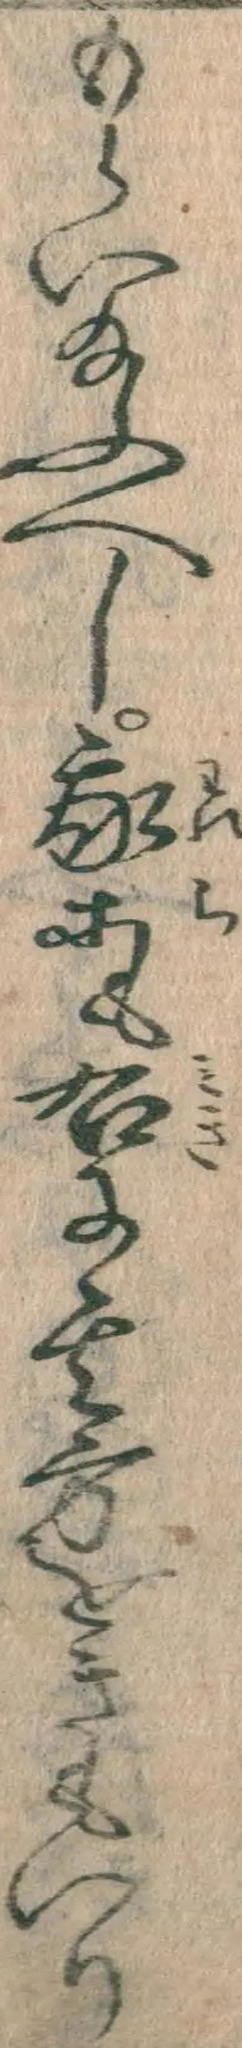もらい給ふへし。我等も右に其方をきもいり
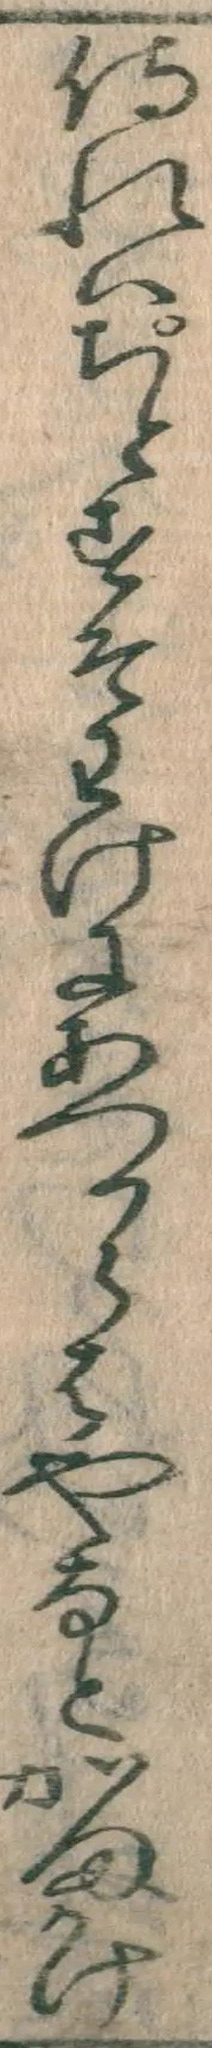侍れは。ちとすそわけにあつからはやなとかまかけ
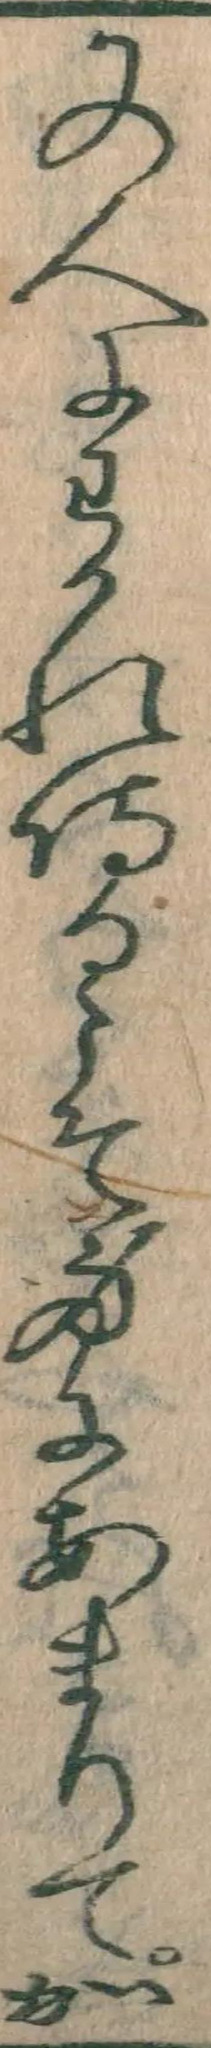かの人にわかれ侍るこそ身にあまりて。か
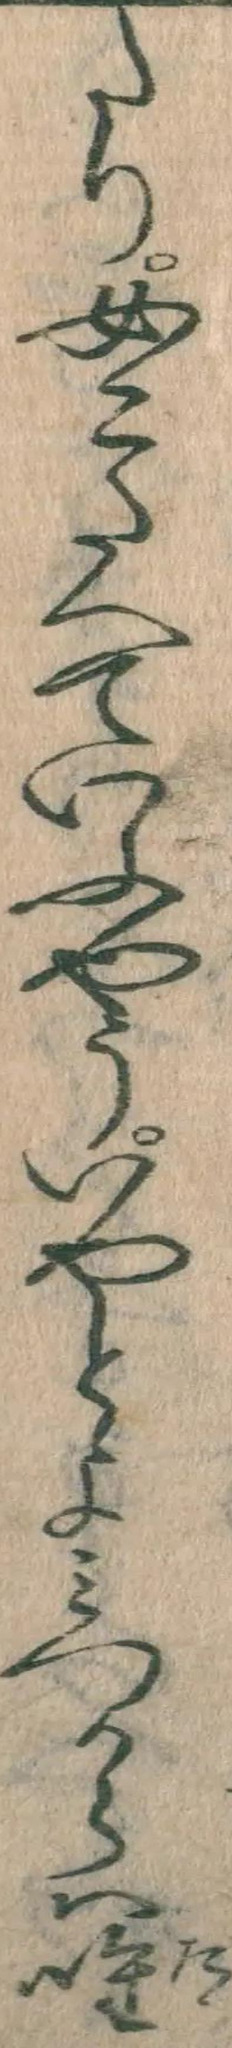たり。女こたへていふやう。いやとよみつからは唯

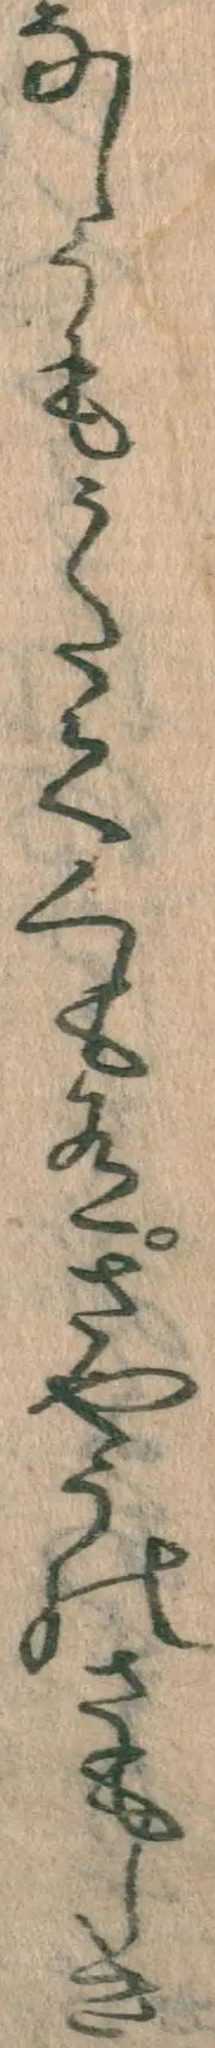なしうもうたてくも有。さやうのさもしき
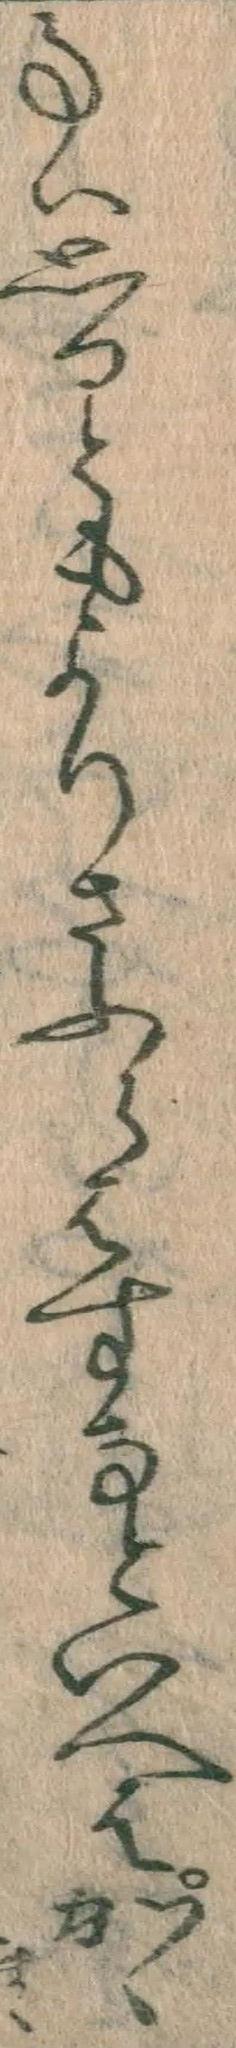事は思ひともよりさふらはすなといへは。かゝ
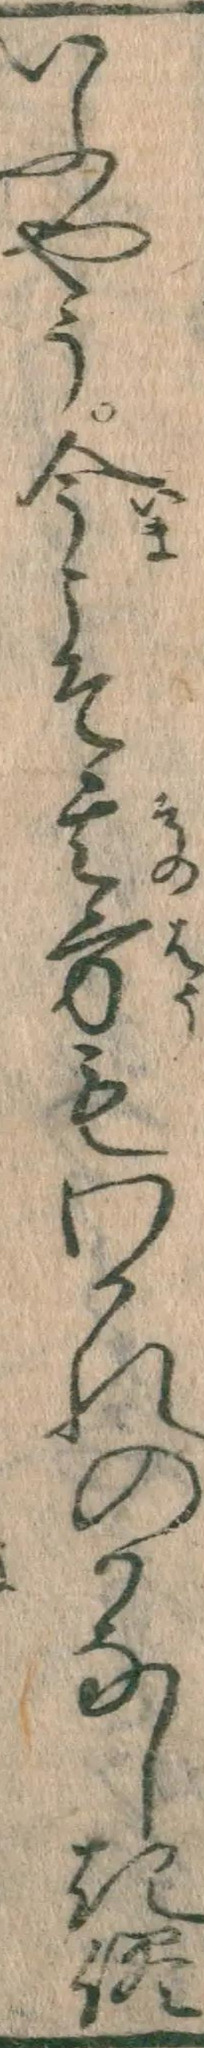いふやう。今こそ其方もわかれのかなしき侭
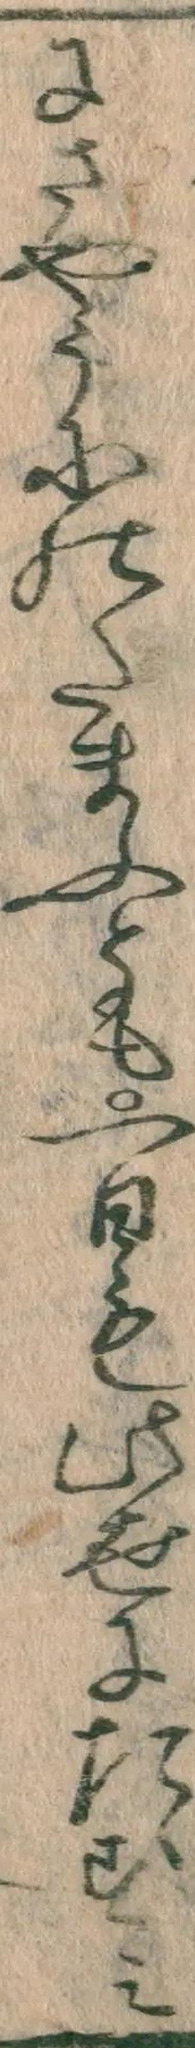にさやうにのたまふとも。一日も此世にたゝすみ
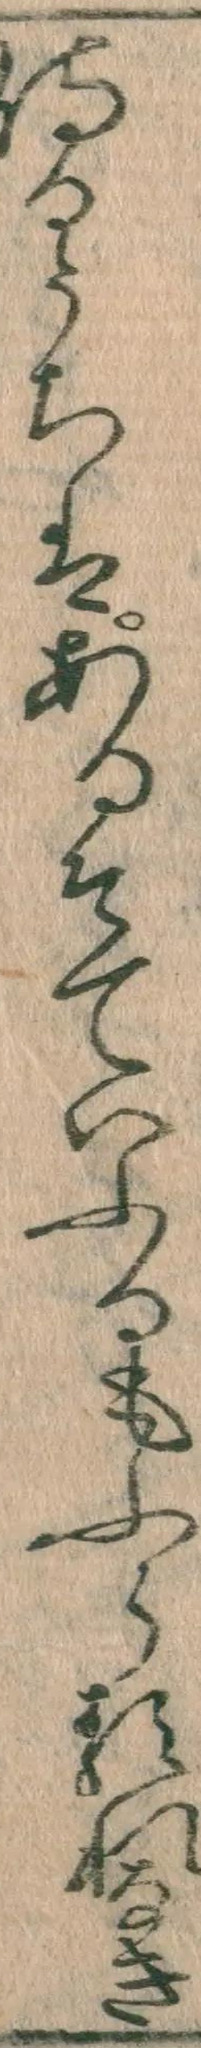侍るうちは。あるそてはふるもふらるれなき
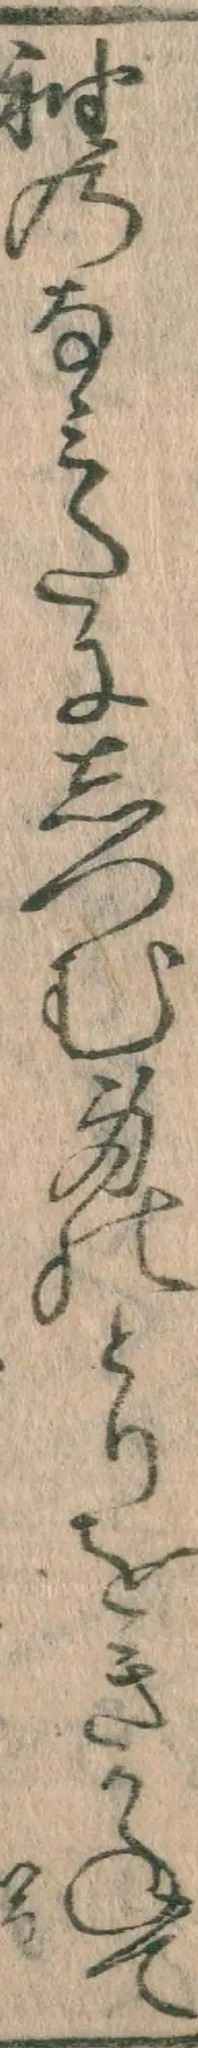袖のなみたにしつむ身のとりをきかねて
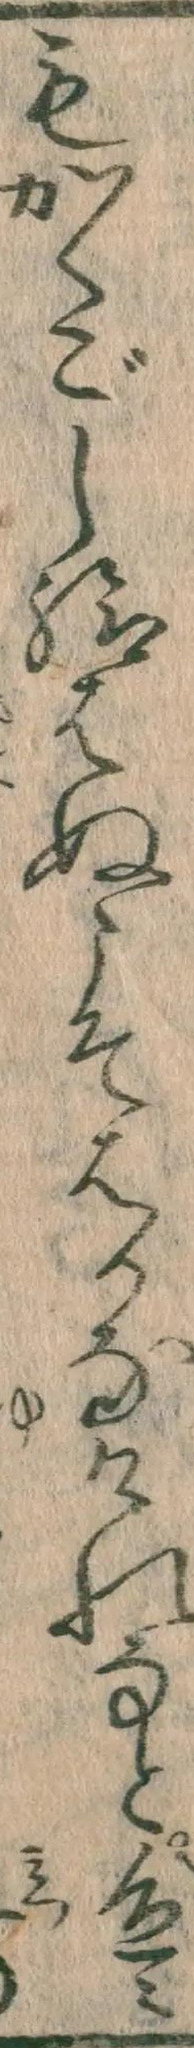もかくごし給はぬこそはかなけれなと。色々
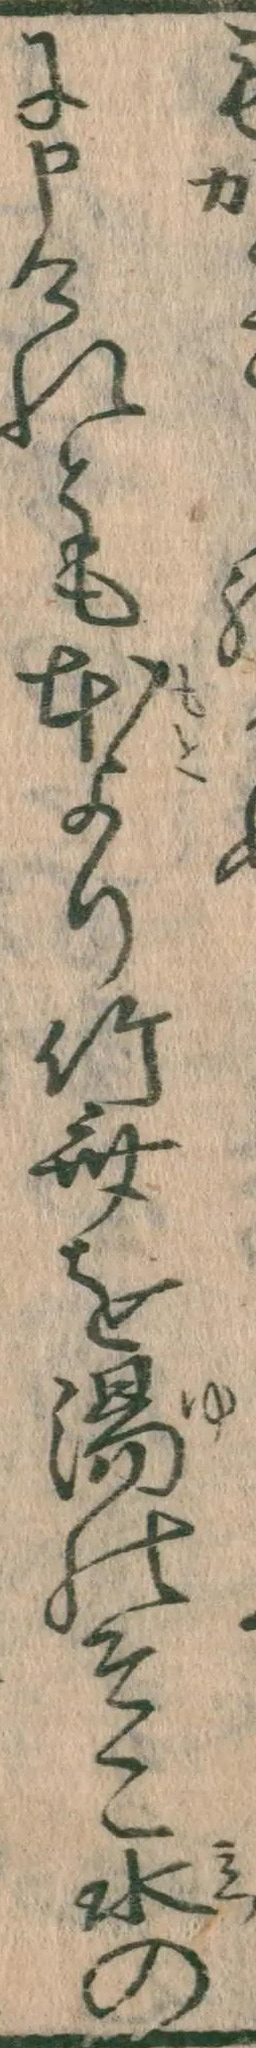に申けれとも本より竹斎を湯のそこ水の
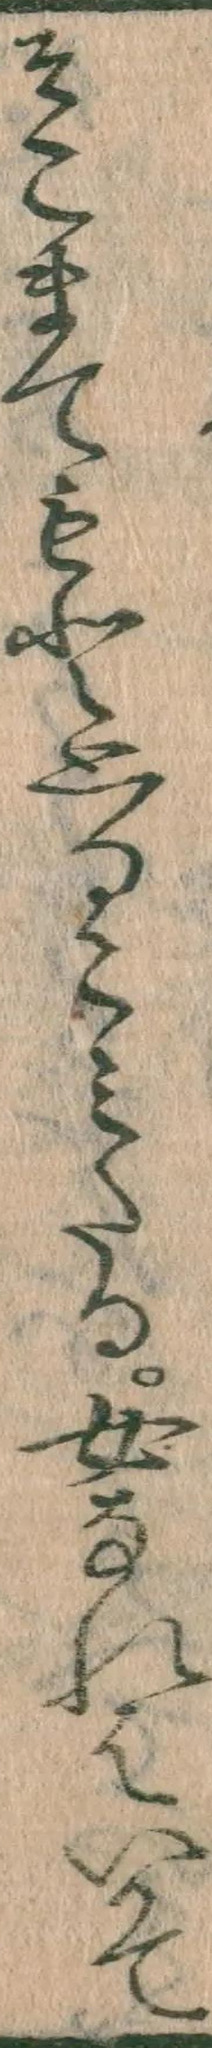そこまてもと思ひこみたる。女なれはいかて
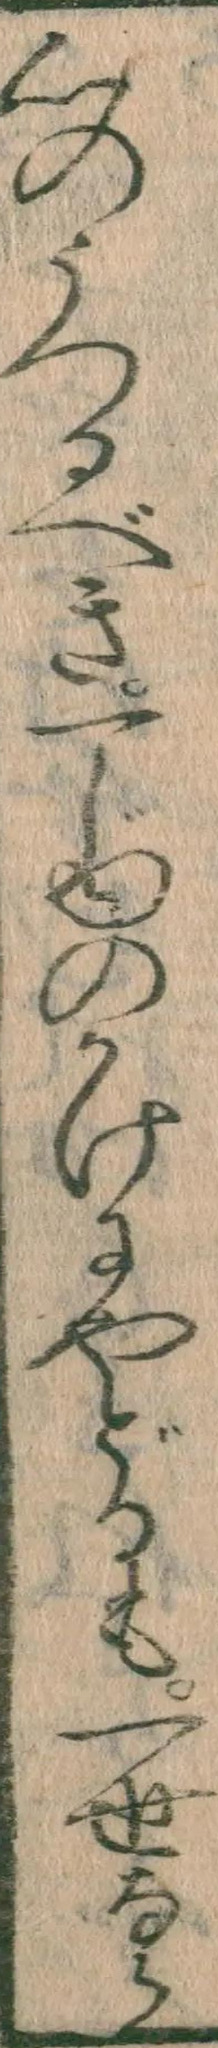心のうつるべき。一じゆのかけにやどるも。一世なら
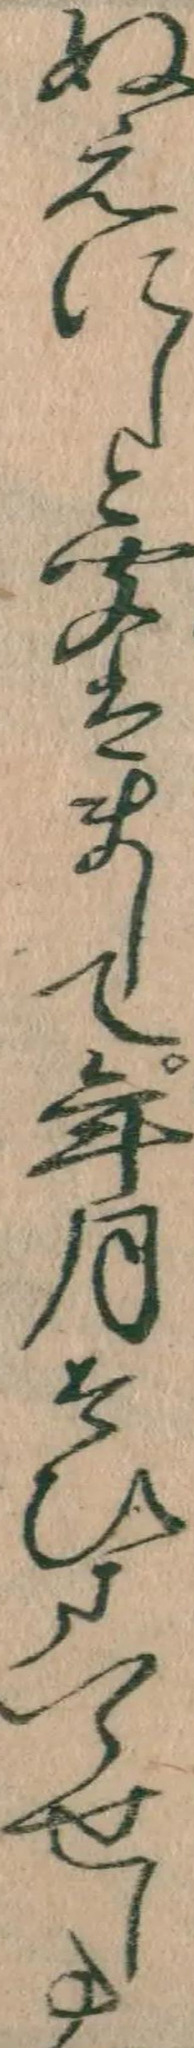ぬえにしと聞はまして。年月そひまいらせし事
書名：竹斎狂歌物語 3巻
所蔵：国立国会図書館 National Diet Library, JAPAN
